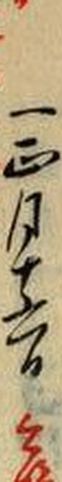一正月廿七日
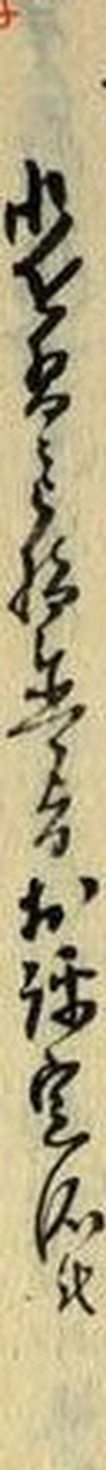御近習番ニ被指置候旨於評定所被
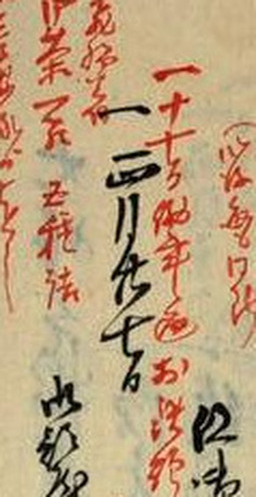一正月廿七日
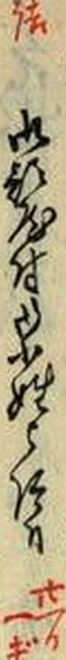御部屋付御小姓被仰付
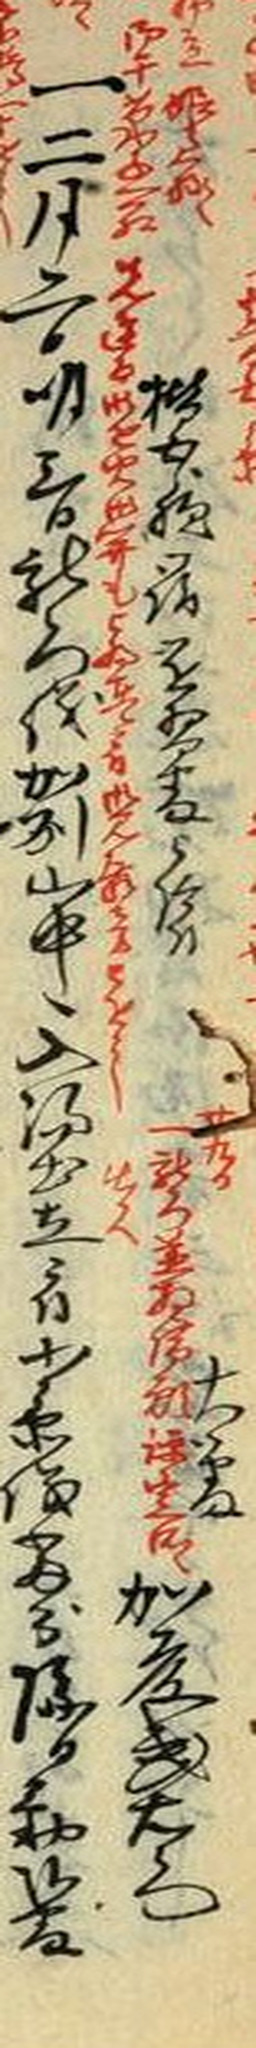一二月二日明三日新右衛門儀加州山中へ入湯出立ニ付小兵衛儀当分隔日勤弐番
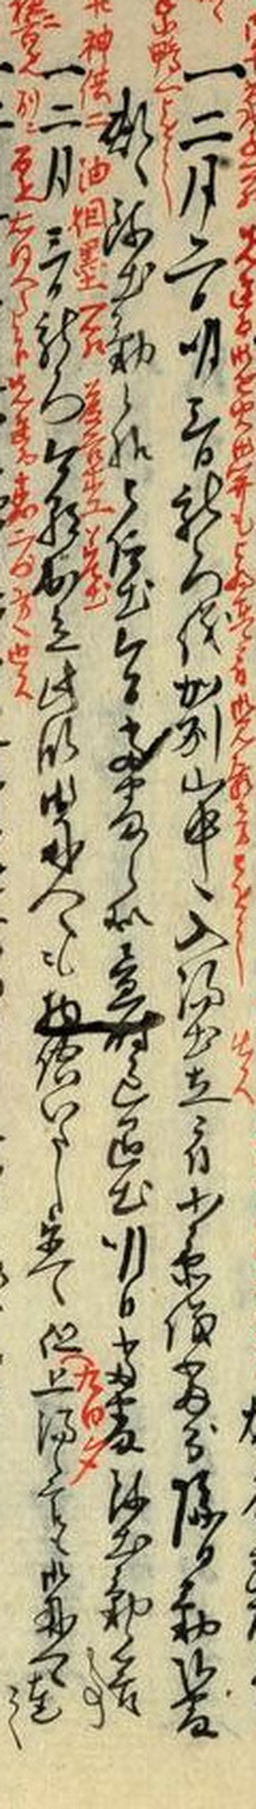頬へ致出勤候様被仰出今日当番之処昼時過退出明日当番致出勤候筈
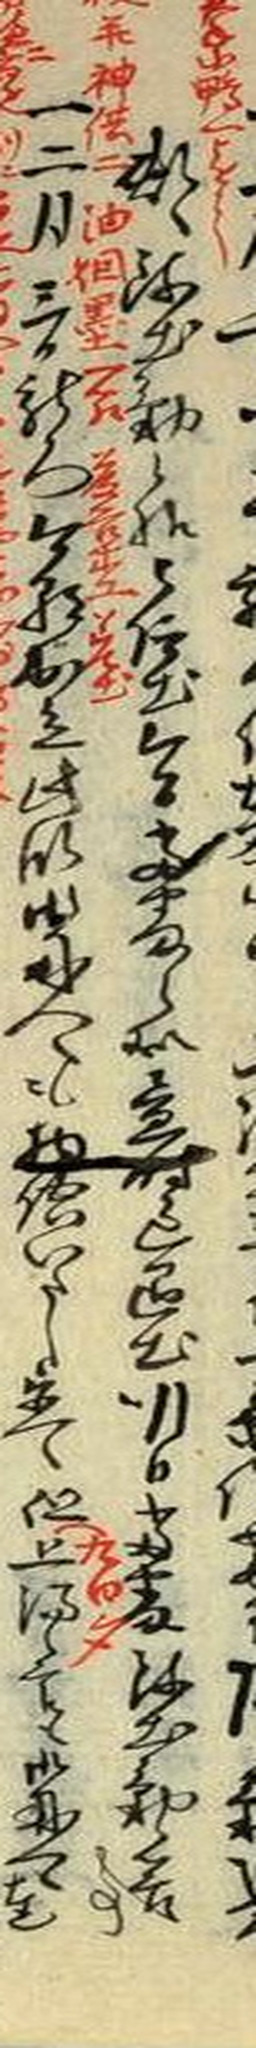一二月三日新右衛門今朝出立此段御用人へも物語いたし置候但上帰候節も御用人へ達之
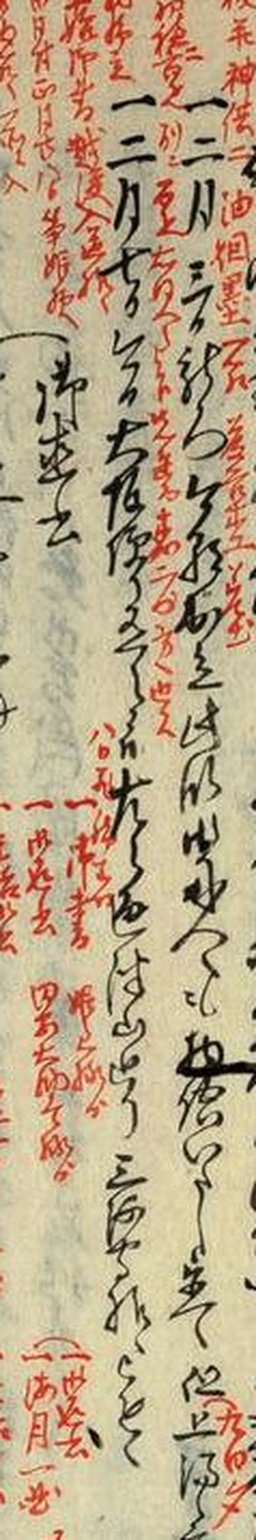一二月七日今日大坂便り有之候ニ付左之通津山廻り三河守様へ被進之
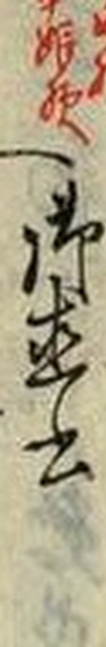御直書
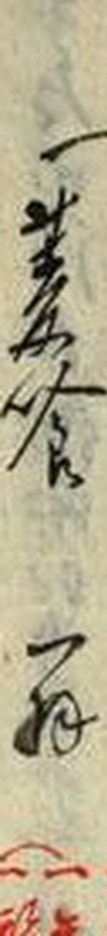菱喰一羽
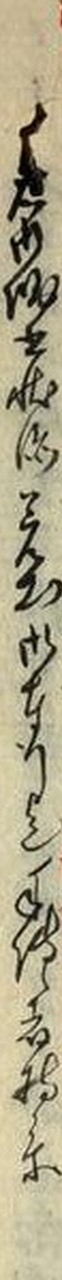右御側書状添差出御奉行迄手伝候者持参
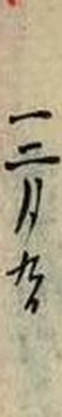一二月九日
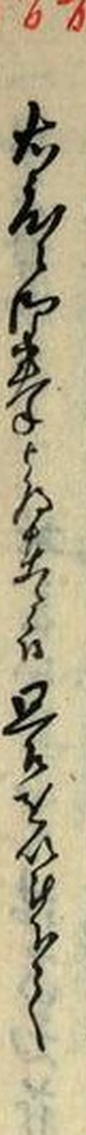右度々御拳被為在候ニ付思召を以被下之
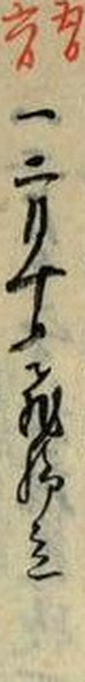一二月十日飛脚立

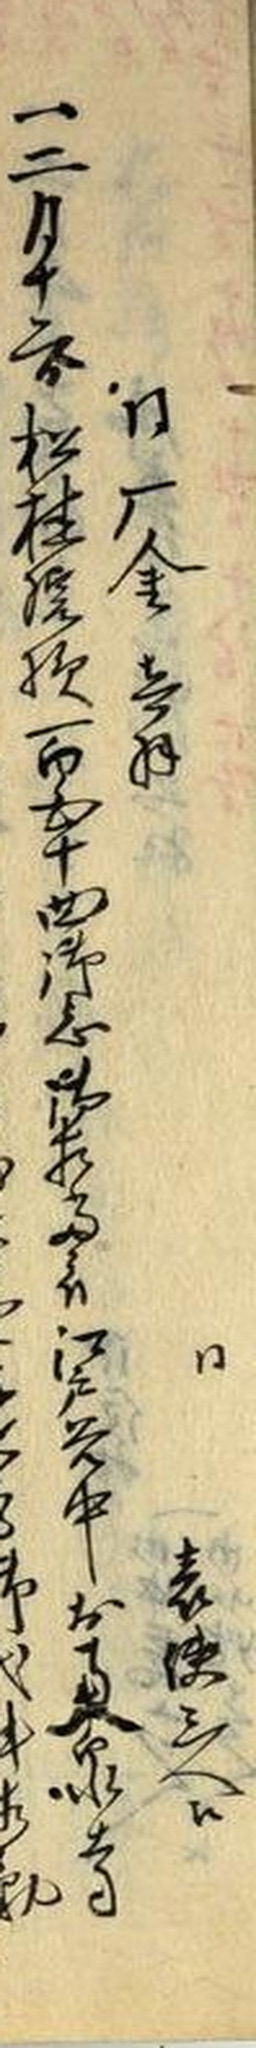一二月十二日松桂院様百五十回御忌相当ニ付江戸谷中於南泉寺
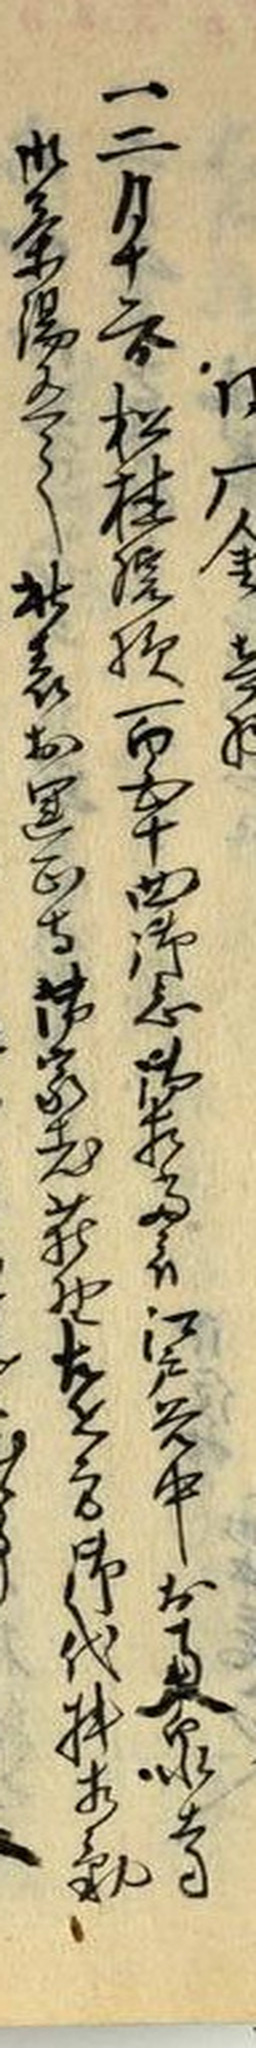御茶湯有之此表於運正寺御家老荻野左近方御代拝相勤
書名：少傅日録抄（斉承付側向頭取日記、在国）
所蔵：福井県文書館 Fukui Prefectural Archives
